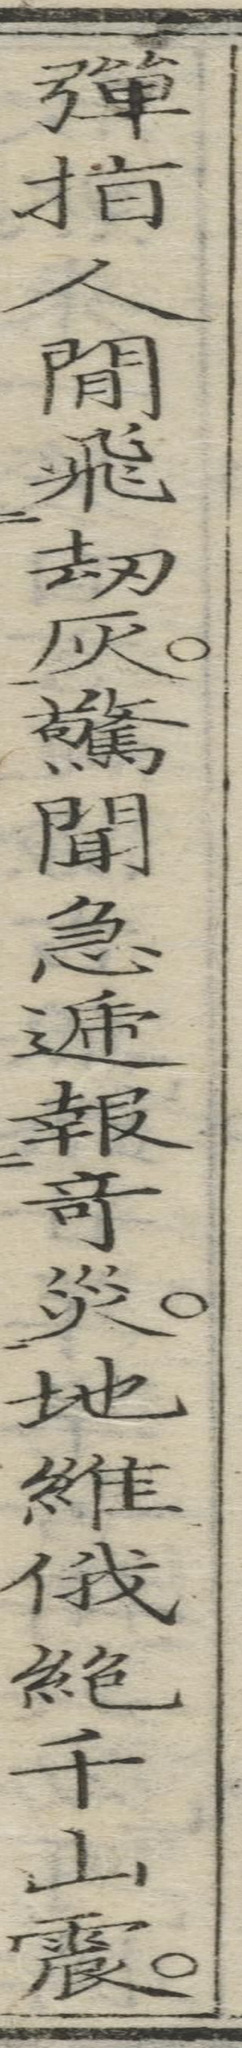弾指人間飛刼灰驚聞急逓報奇災地維俄絶千山震
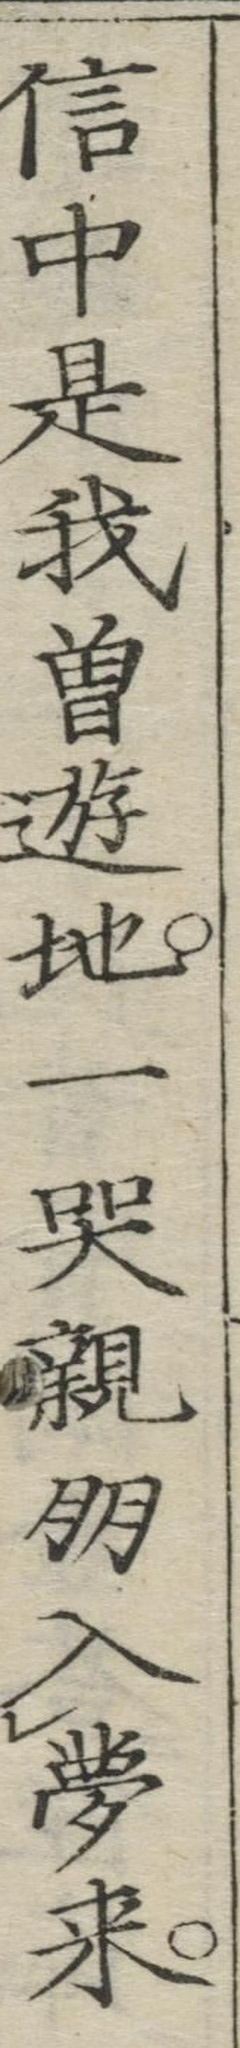信中是我曽遊地一哭親朋入夢来
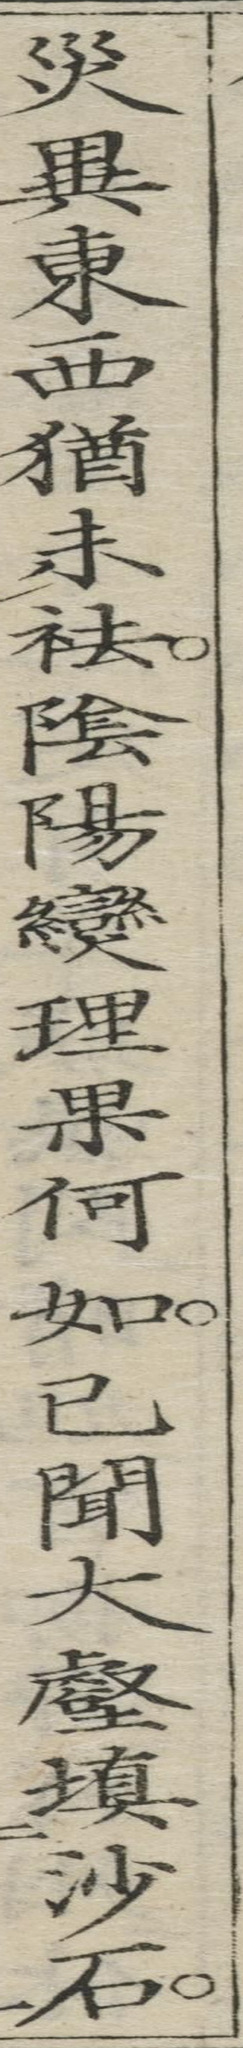災異東西猶未袪陰陽変理果何如已聞大壑填沙石
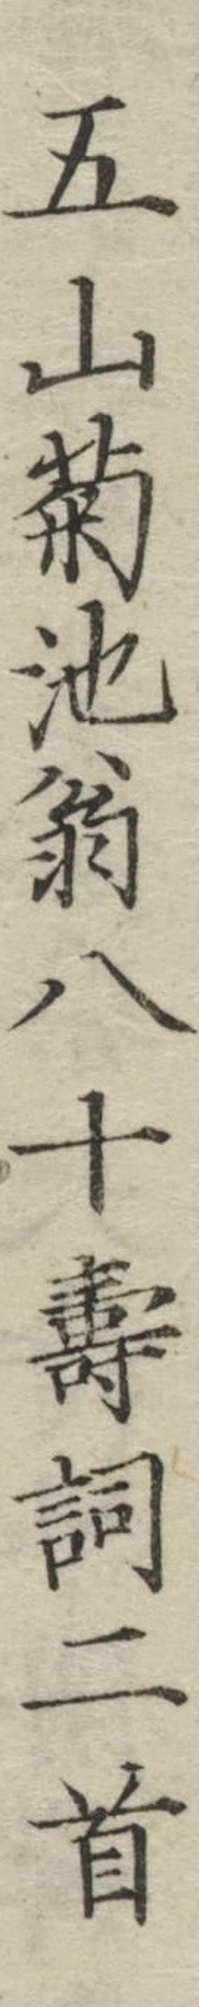五山菊池翁八十寿詞二首
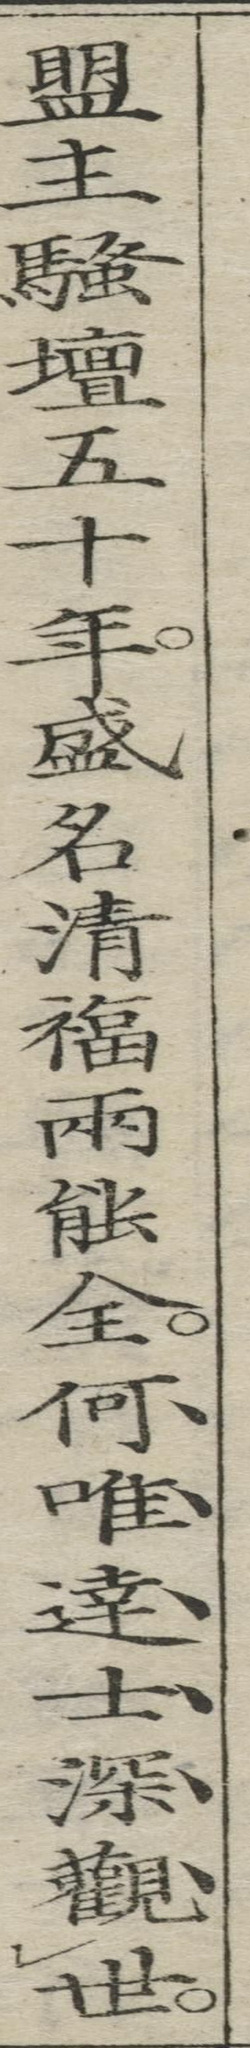盟主騒壇五十年盛名清福両能全何唯達士深観世
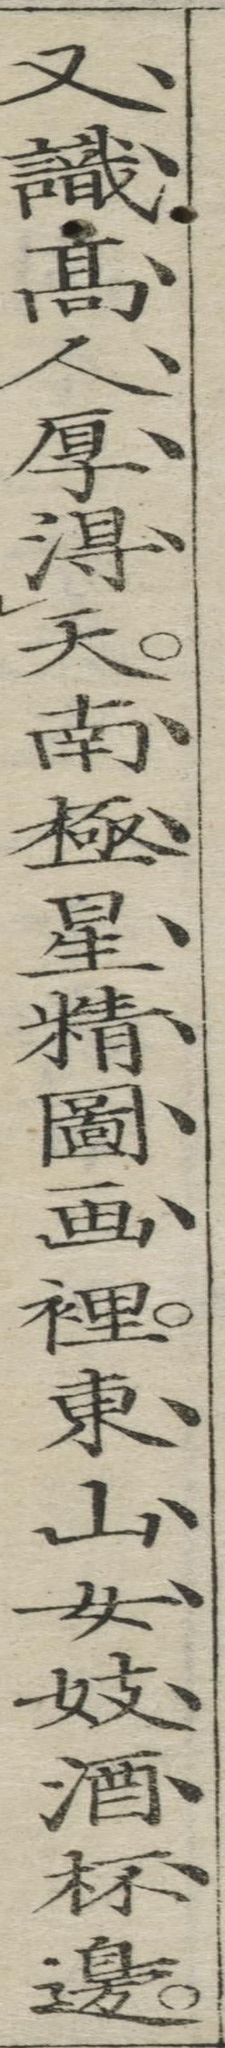又識高人厚得天南極星精図画裡東山女妓酒杯辺
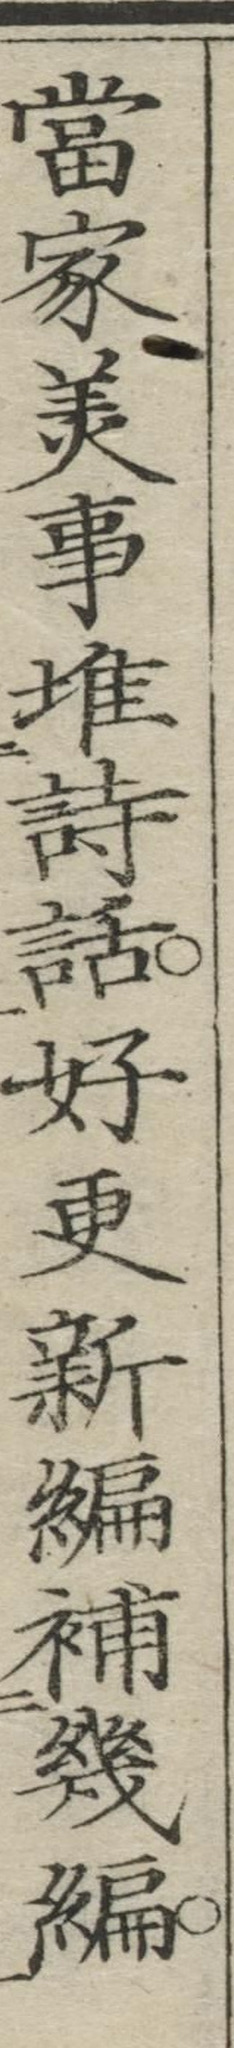当家美事堆詩話好更新編補幾編
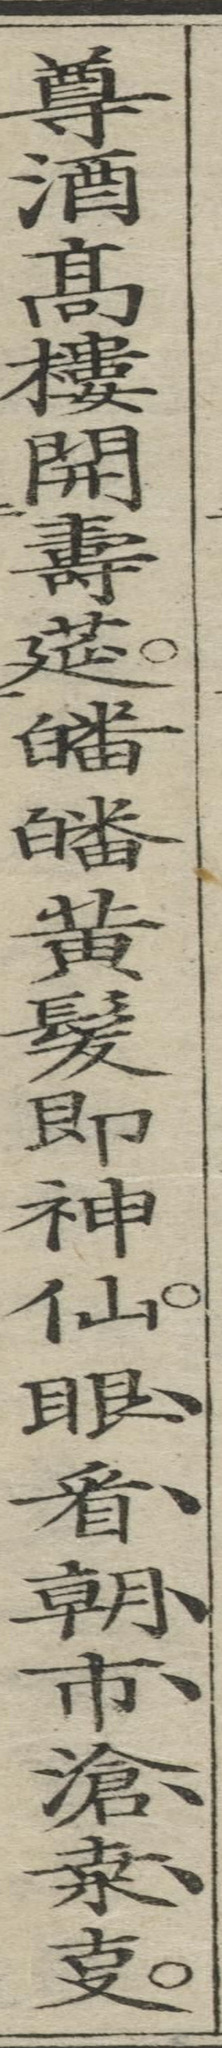尊酒高楼開寿筵皤皤黄神即神仙眼看朝市滄桑事

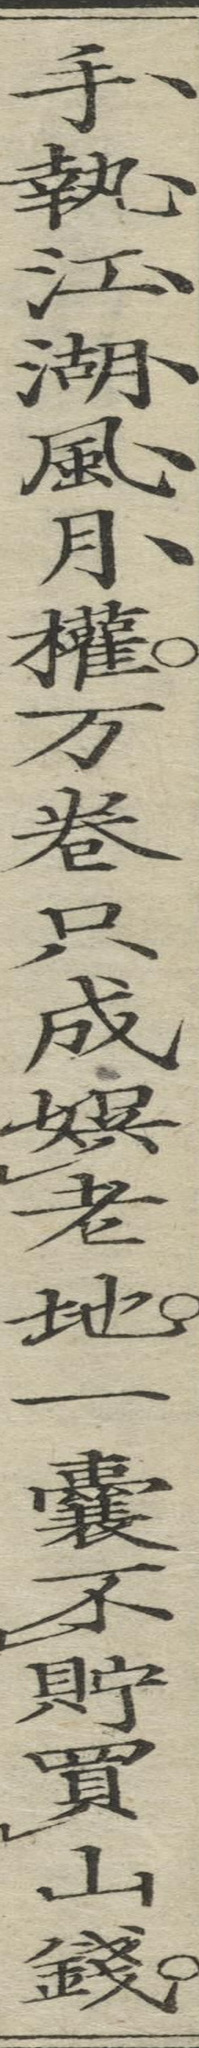手執江湖風月権万巻只成娯老地一嚢不貯買山銭
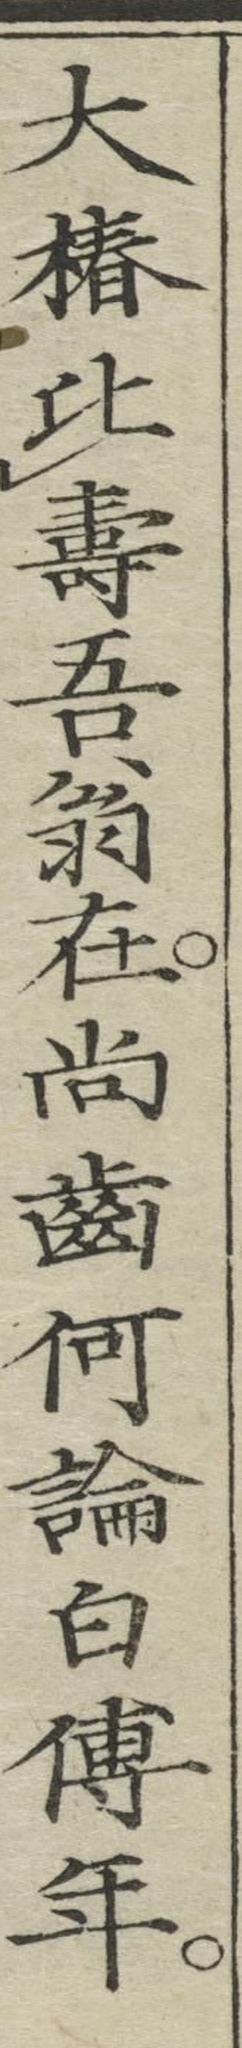大椿比壽吾翁在猶歯何論白伝年
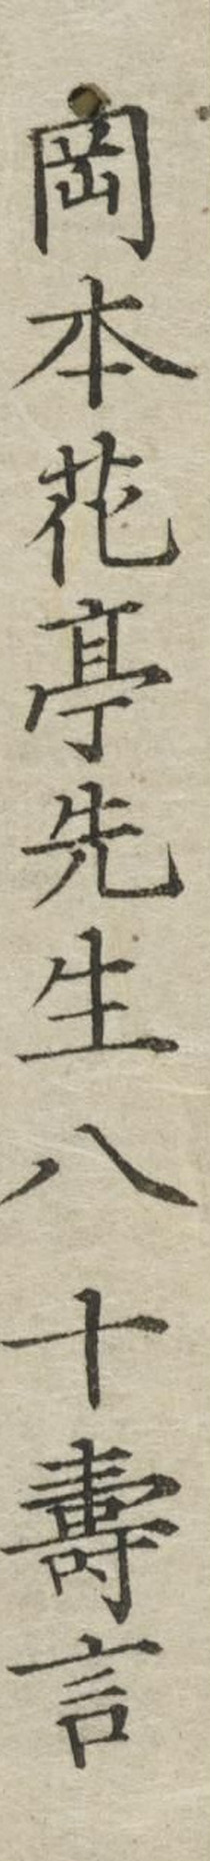岡本花亭先生八十寿言
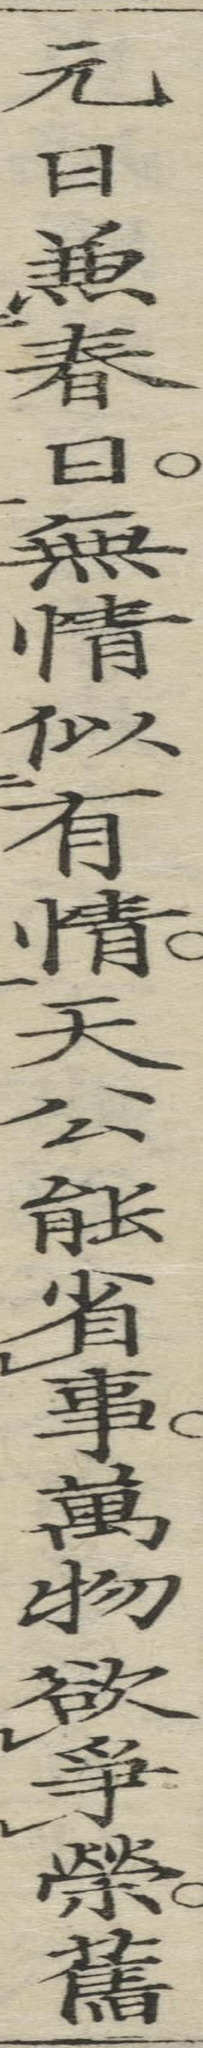元日兼春日無常似有情天公能省事萬物欲争栄旧
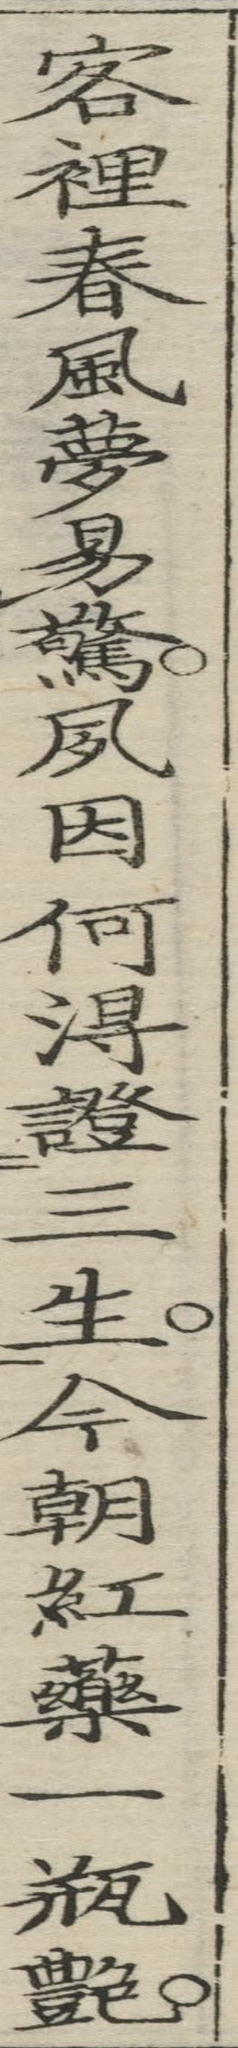客裡春風夢易驚夙因何得證三生今朝紅薬一瓶艶
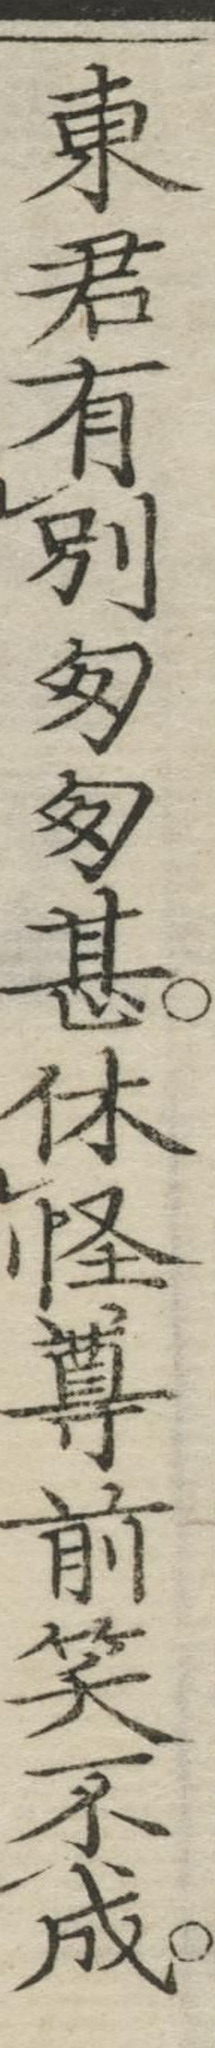東君有別匆匆甚休怪尊前笑不成
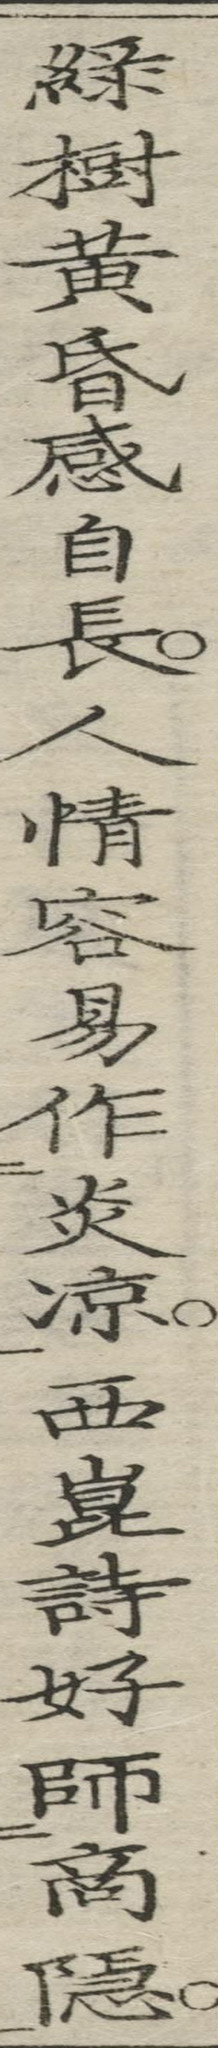緑樹黄昏感自長人情容易作炎涼西崑詩好師商隠
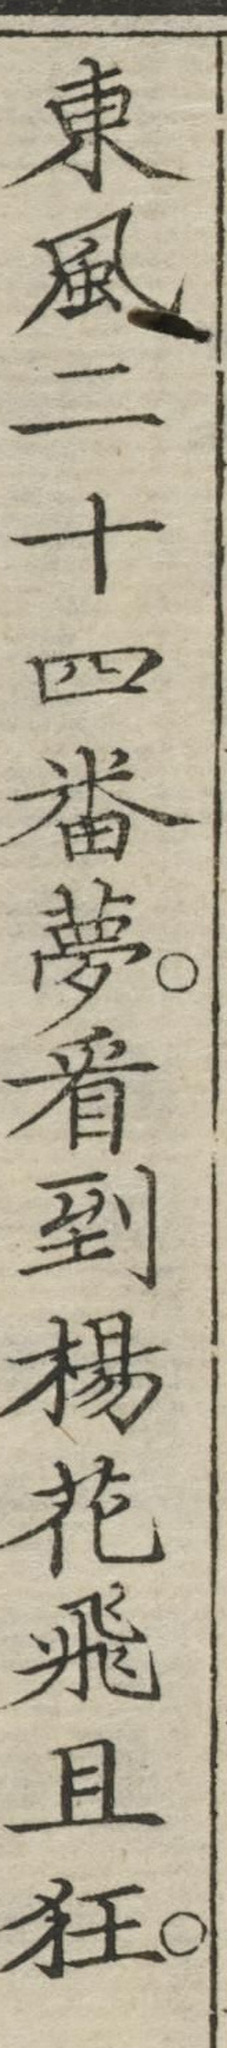東風二十四番夢看到楊花飛且狂
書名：火後憶得詩
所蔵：東京大学地震研究所図書室 Earthquake Research Institute Library, The University of Tokyo, JAPAN
